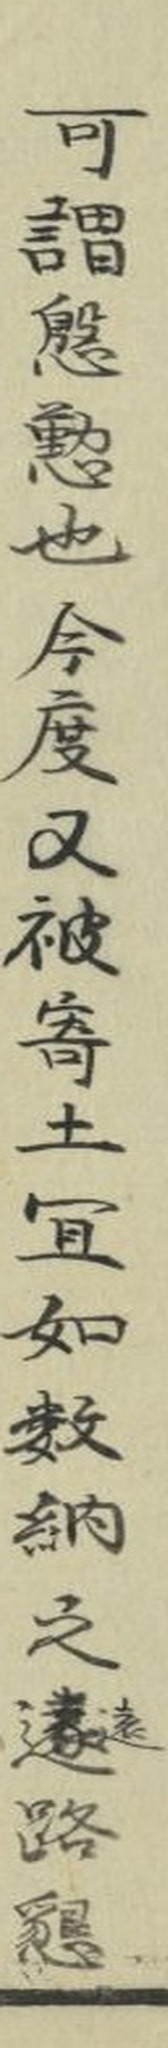可謂慇懃也今度又被寄土冝如数納之遠路懇
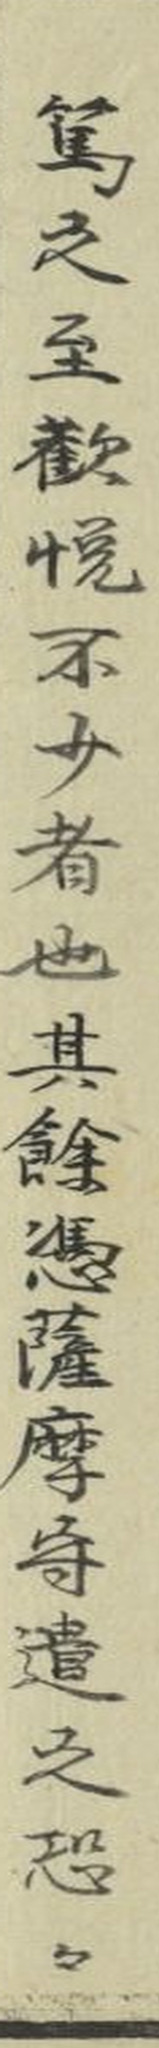篤之至歓悦不少者也其余馮薩摩守遣之恐々
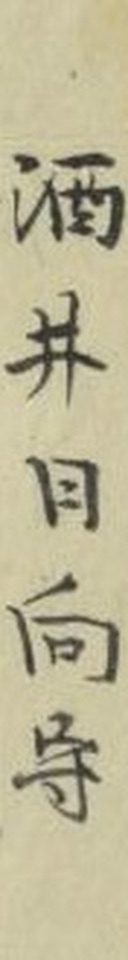酒井日向守
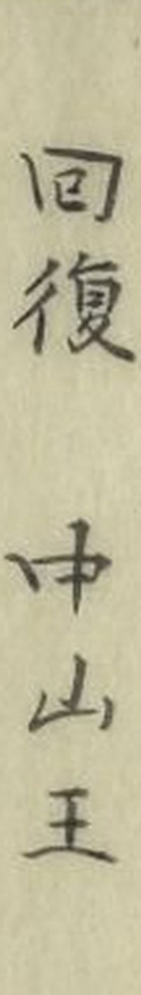回復中山王

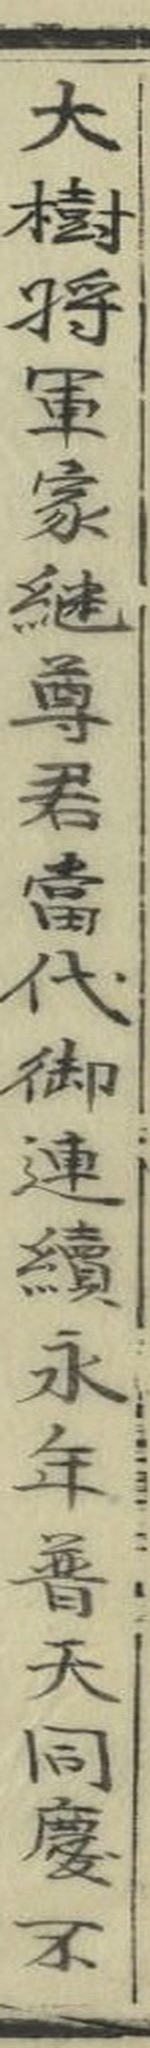大樹将軍家継尊君当代御連続永年普天同慶不
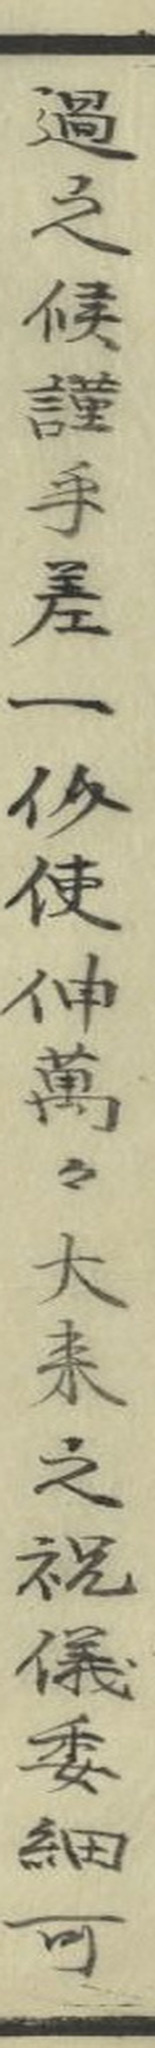過之候謹乎差一价使伸万々大来之祝儀委細可
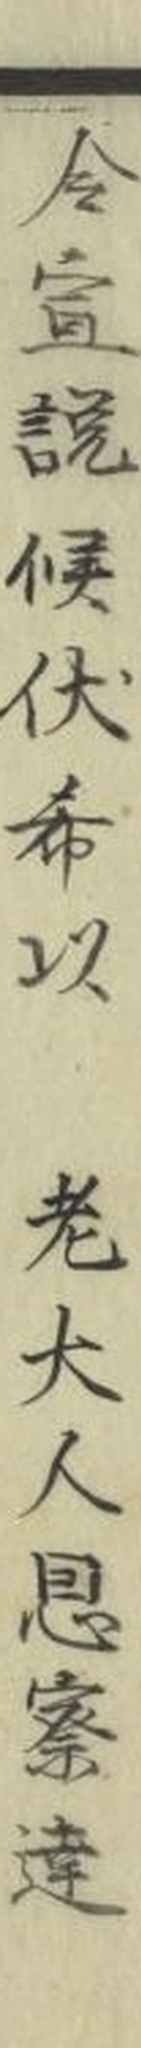令宣説候伏希以老大人恩察達
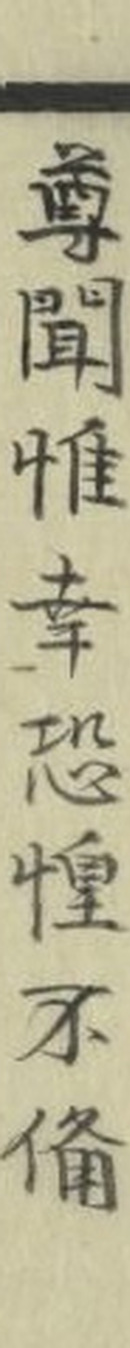尊聞惟幸恐惶不備
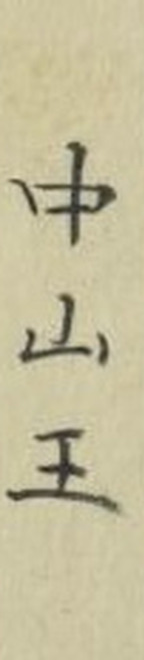中山王
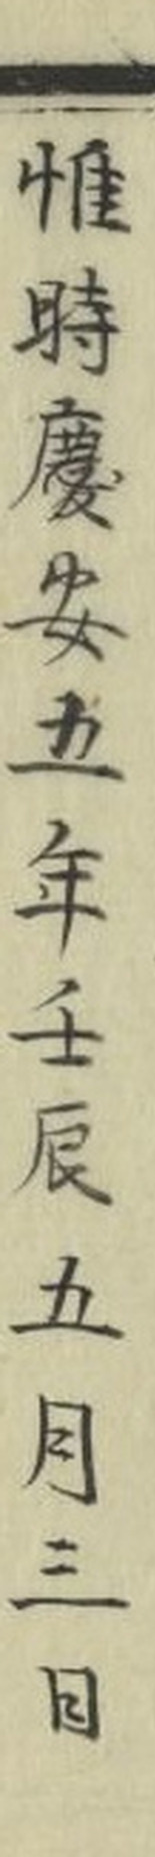惟時慶安五年壬辰五月三日尚質
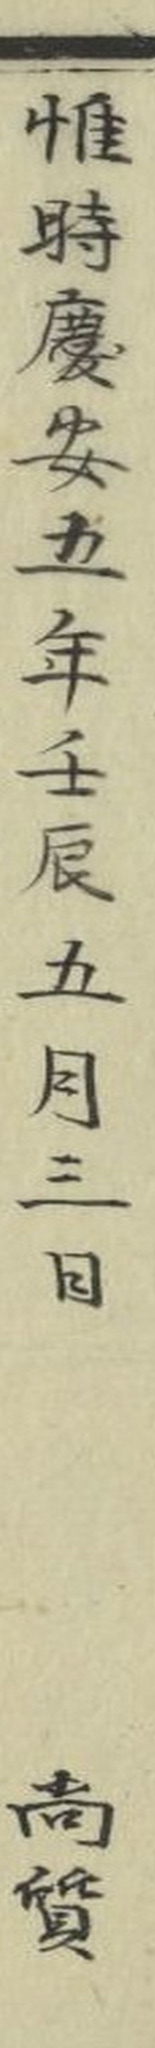惟時慶安五年壬辰五月三日尚質
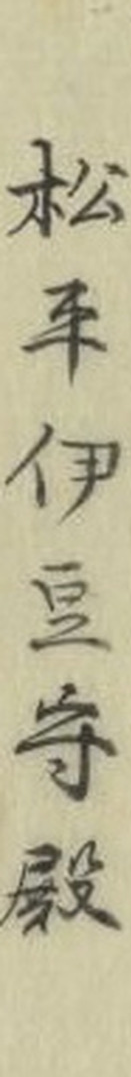松平伊豆守殿
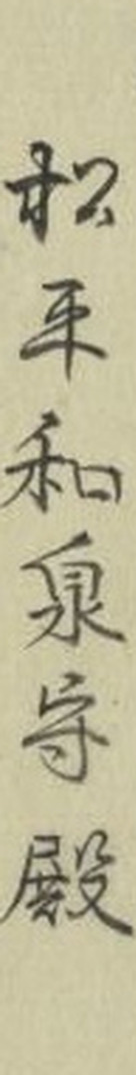松平和泉守殿
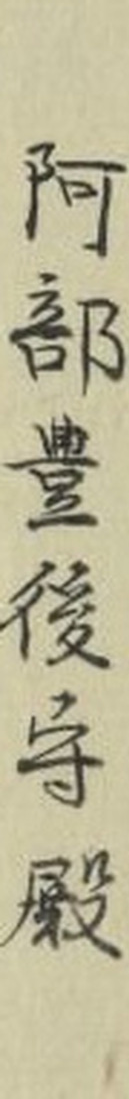阿部豊後守殿
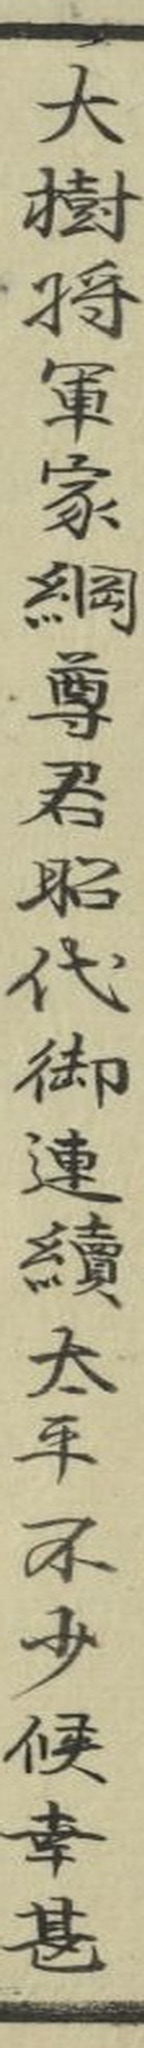大樹将軍家綱尊君昭代御連続太平不少候幸甚
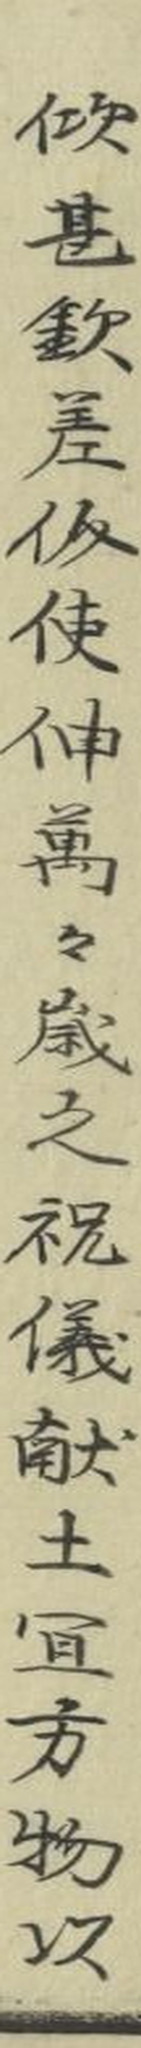傾甚欽差价使伸万々歳之祝儀献土冝方物以
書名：琉球往来（上）
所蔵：University of the Ryukyus Library
